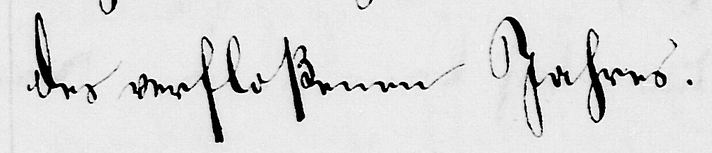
des verfloßenen Jahres.
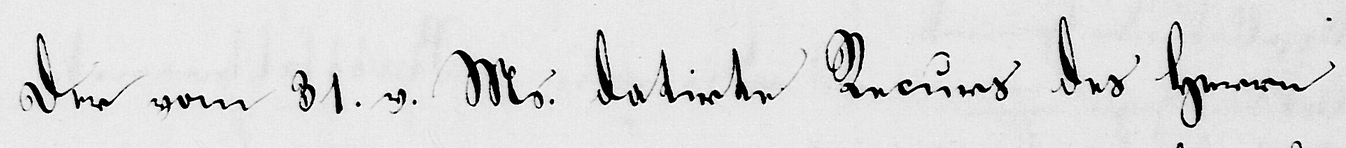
Der vom 31. v. Ms. datirte Recurs des Herrn
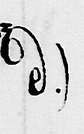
J.
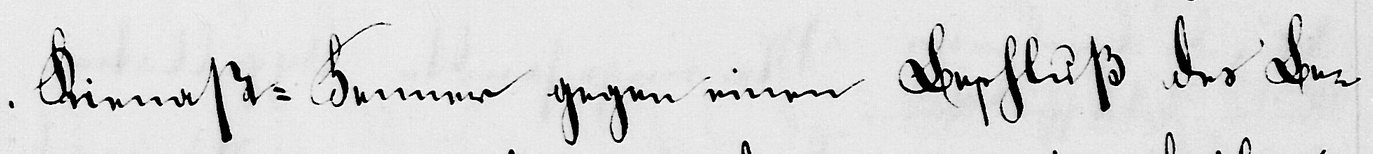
Kienast-Fenner gegen einen Beschluß des Be¬
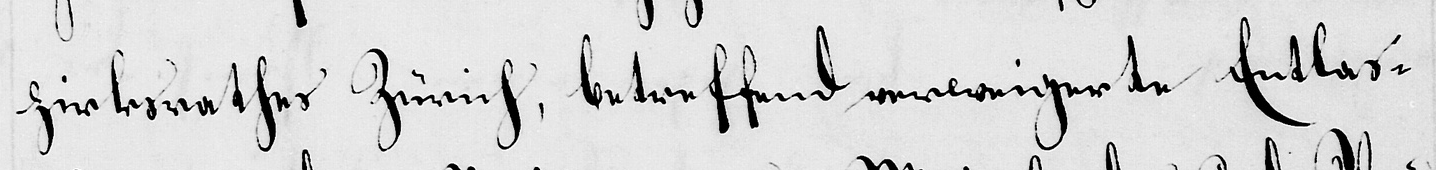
zirksrathes Zürich, betreffend verweigerte Entlas¬
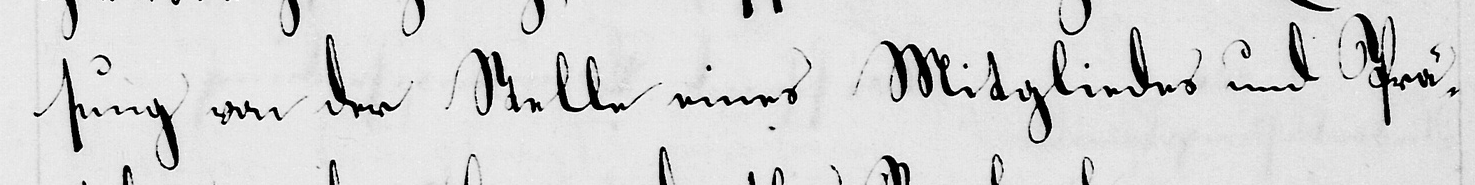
sung von der Stelle eines Mitgliedes und Pr¬
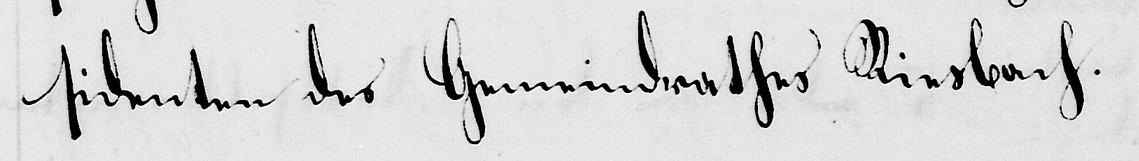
äsidenten des Gemeindrathes Riesbach.
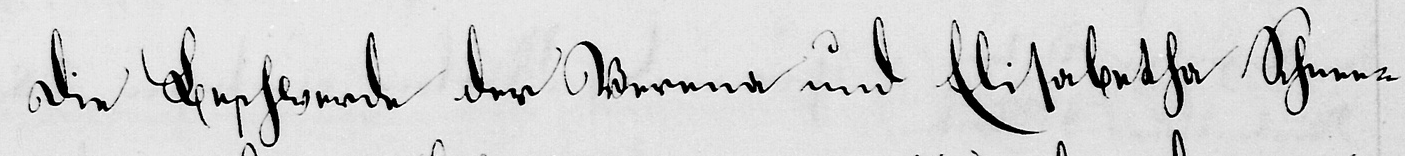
Die Beschwerde der Verena und Elisabetha Schne¬
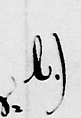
d.)
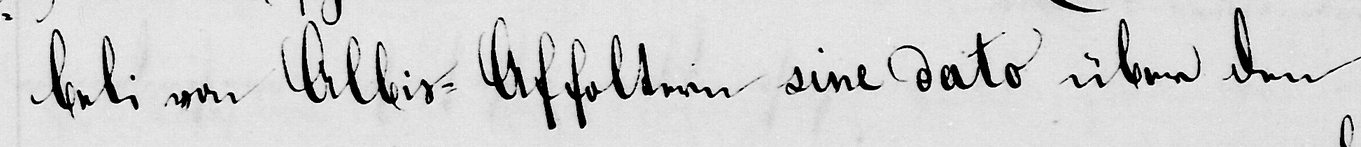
ebeli von Albis-Affoltern sine dato über den
